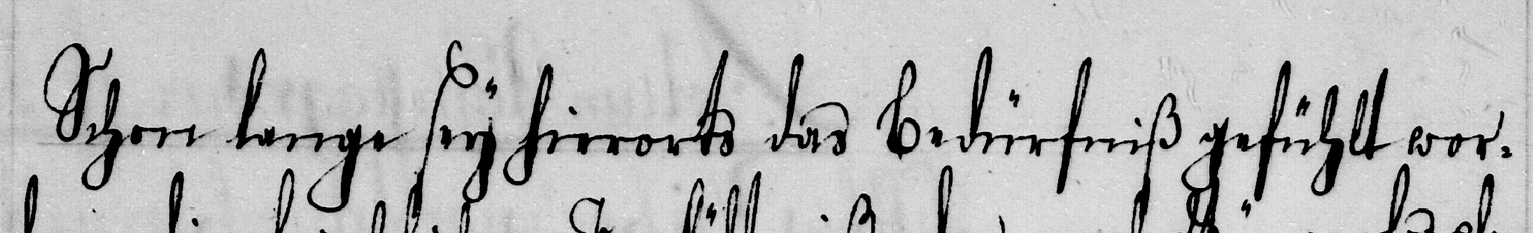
Schon lange sey hierorts das Bedürfniß gefühlt wor¬
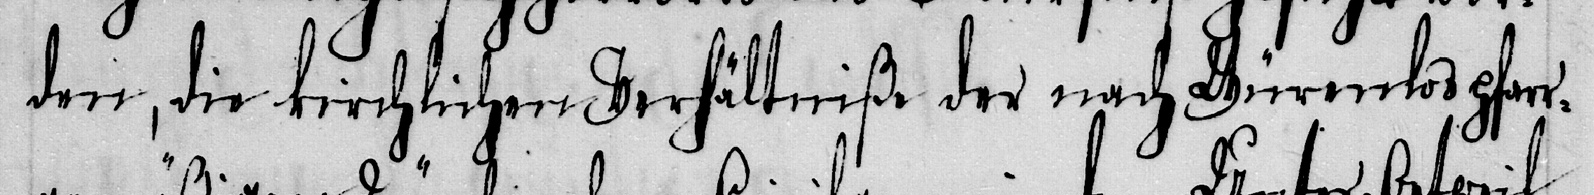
den, die kirchlichen Verhältniße der nach Würenlos pfarr¬
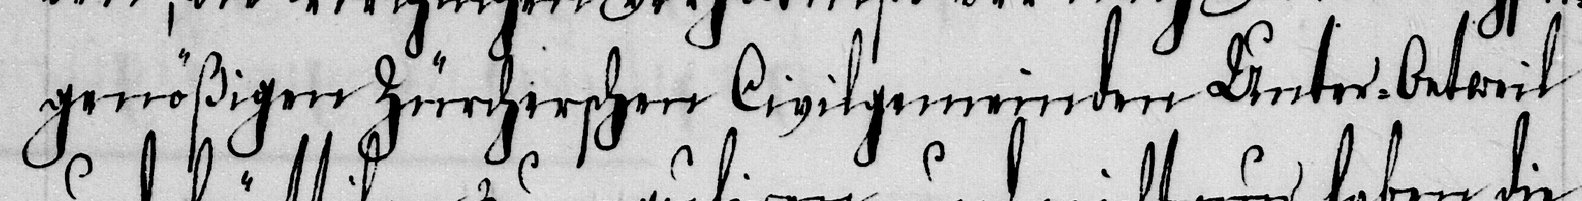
genößischen Zürcherschen Civilgemeinden Unter-Oetweil
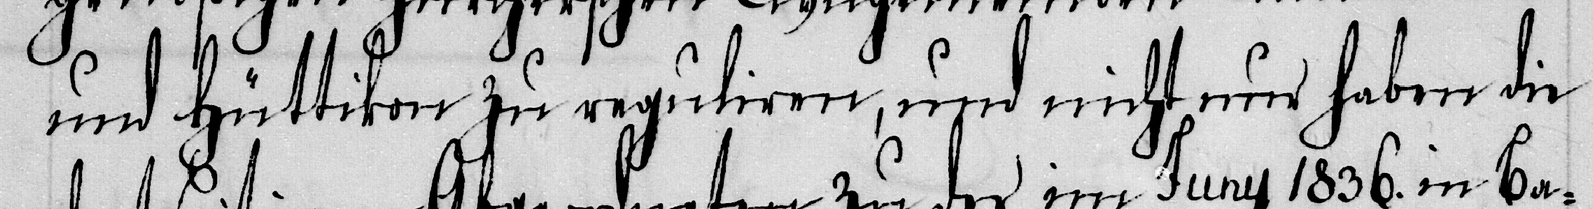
und Hüttikon zu reguliren, und nicht nur haben die
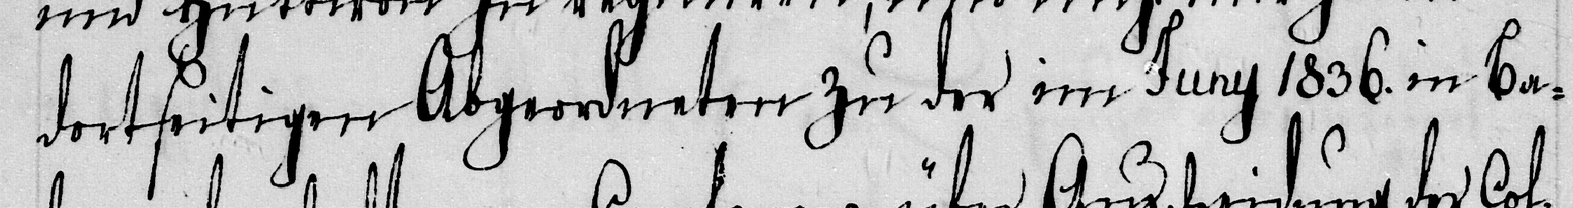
dortseitigen Abgeordneten zu der im Juny 1836. in Ba¬
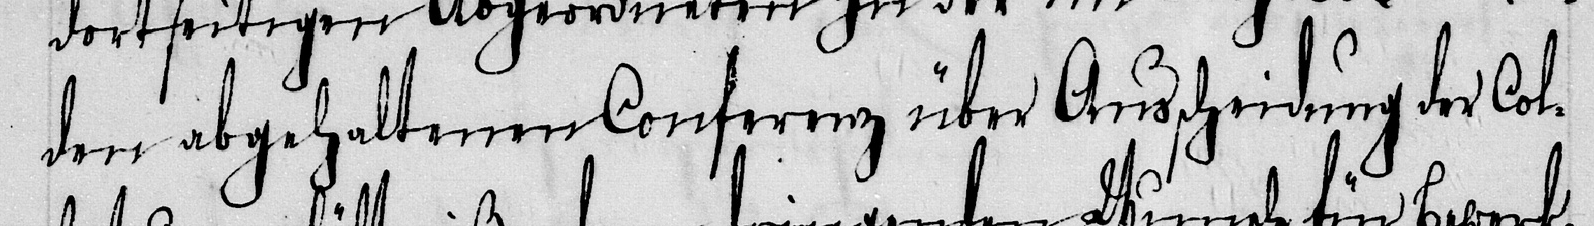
den abgehaltenen Conferenz über Ausscheidung der Col¬
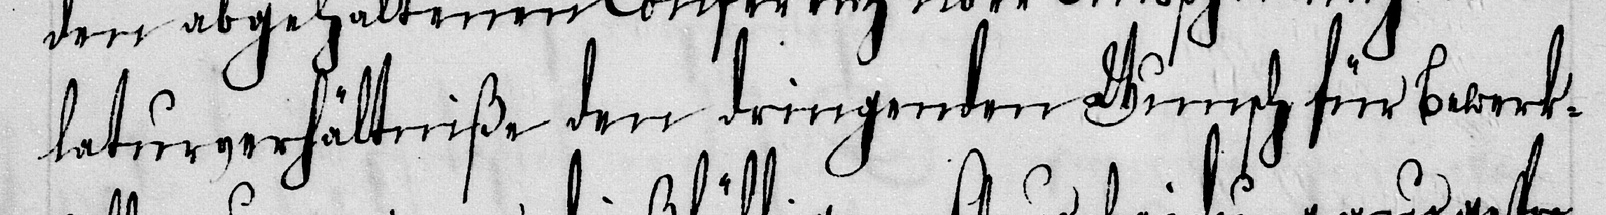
laturverhältniße den dringenden Wunsch für Bewerk¬
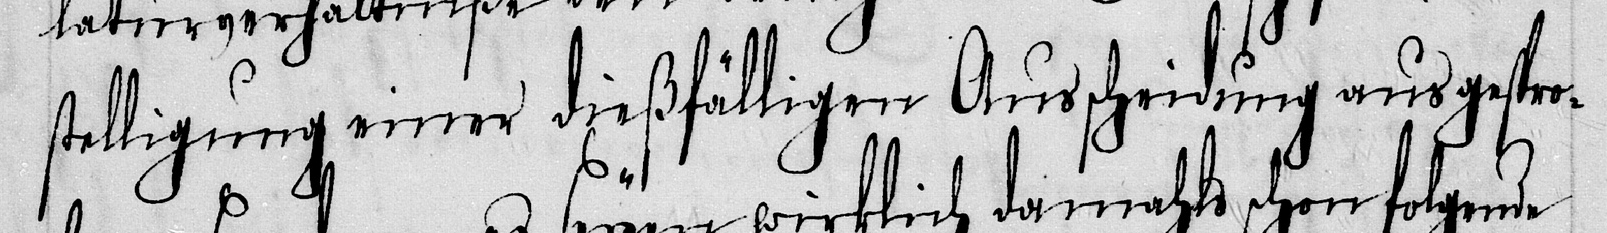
stelligung einer dießfälligen Ausscheidung ausgespr¬
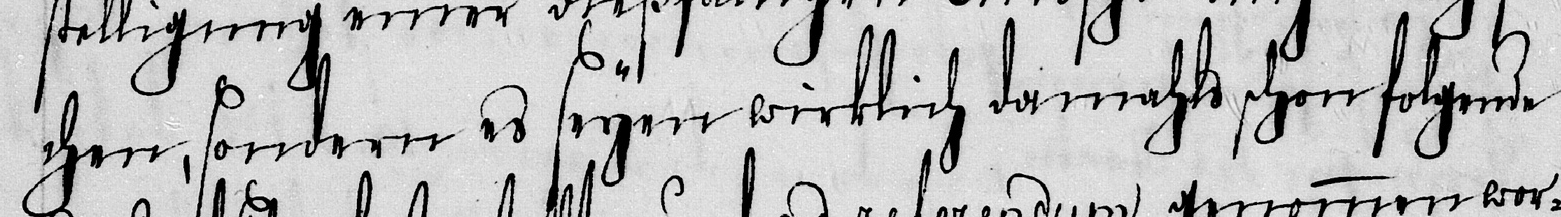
ochen, sondern es seyen wirklich damahls schon folgende
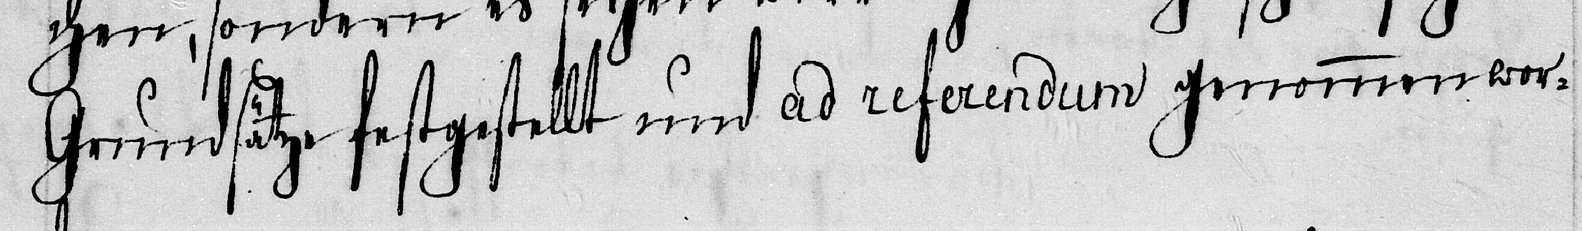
Grundsätze festgestellt und ad referendum genommen wor¬
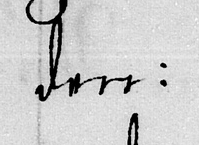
den:
